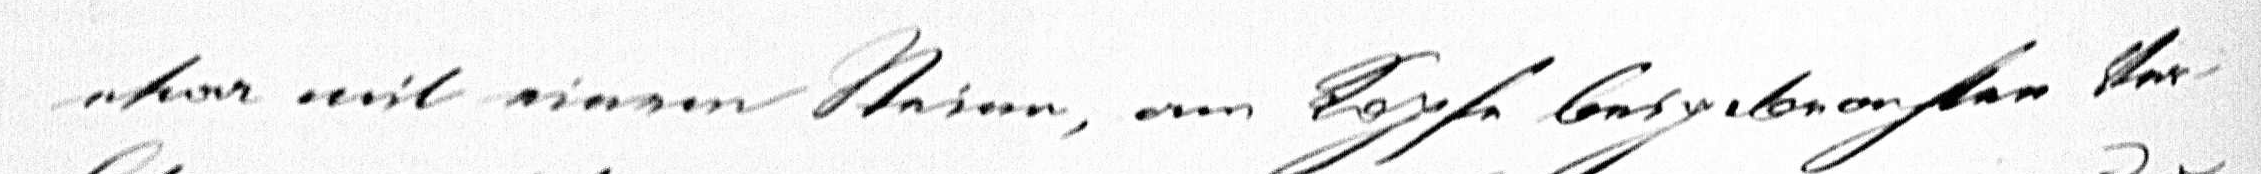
etwa mit einem Steine, am Kopfe beigebrachten Ver¬
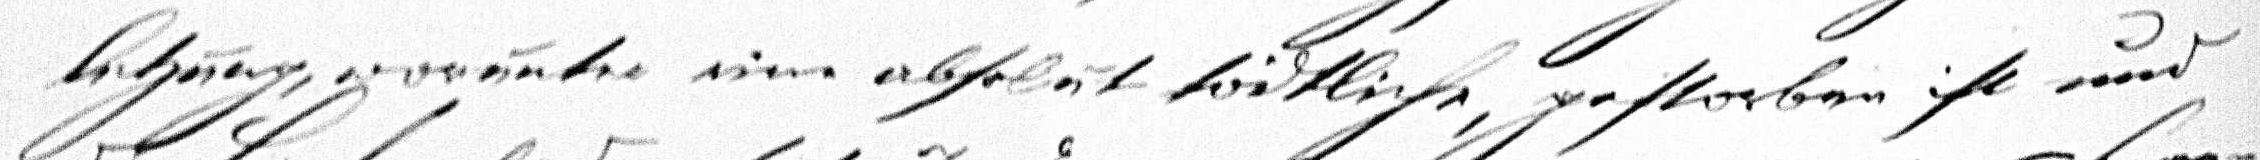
letzung, worunter eine absolut tödliche, gestorben ist und
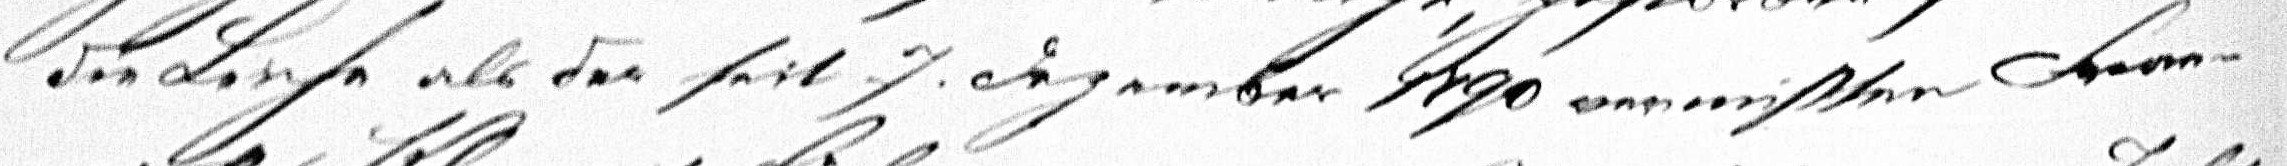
die Leiche als der seit 7. Dezember 1890 vermißten Fran¬
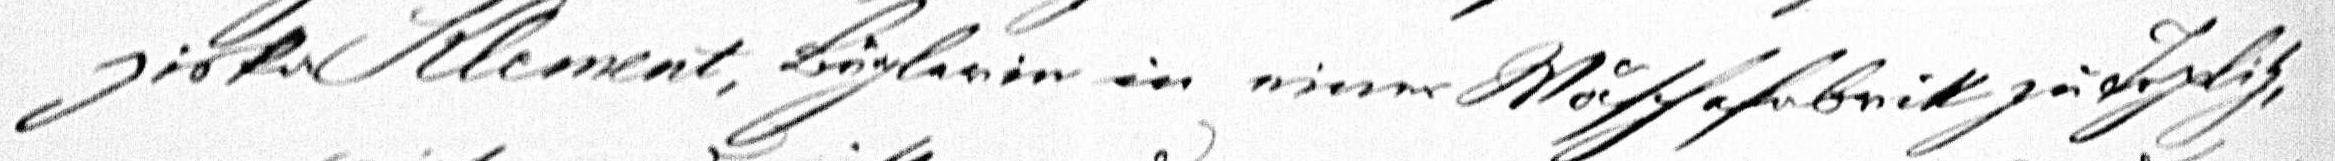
ziska Klement, Büglerin in einer Wäschefabrik zu Toplitz¬
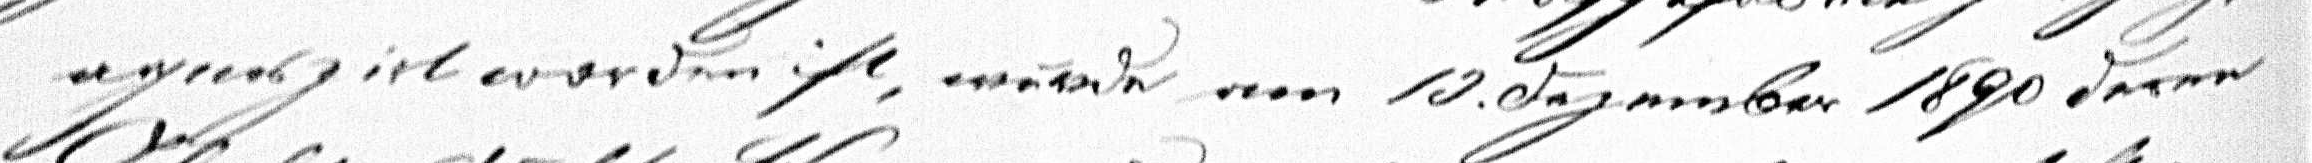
agerz ist worden ist, wurde am 13. Dezember 1890 deren
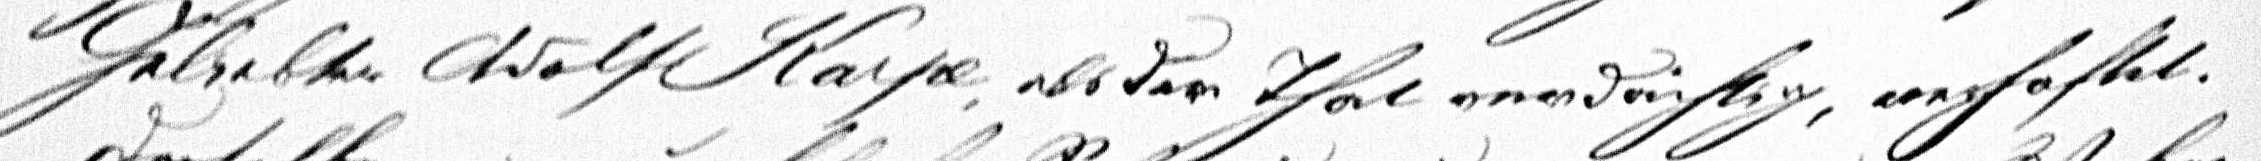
Geliebte Adolf Karpe, als der That verdächtig, verhaftet.
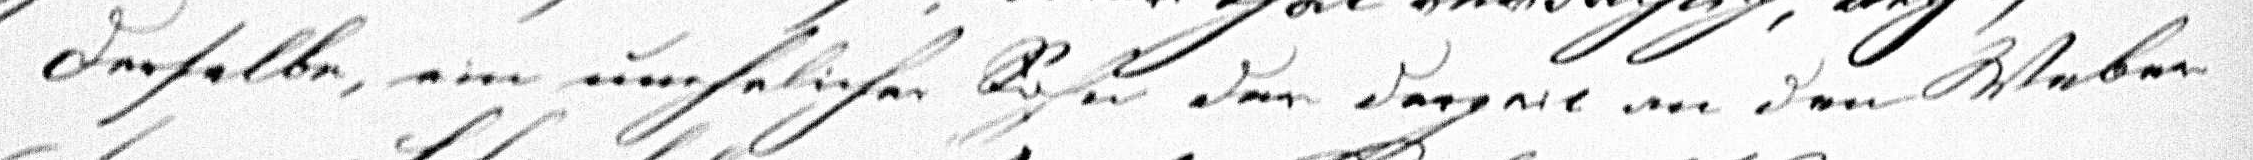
Derselbe, ein unehelicher Sohn der derzeit an den Weber
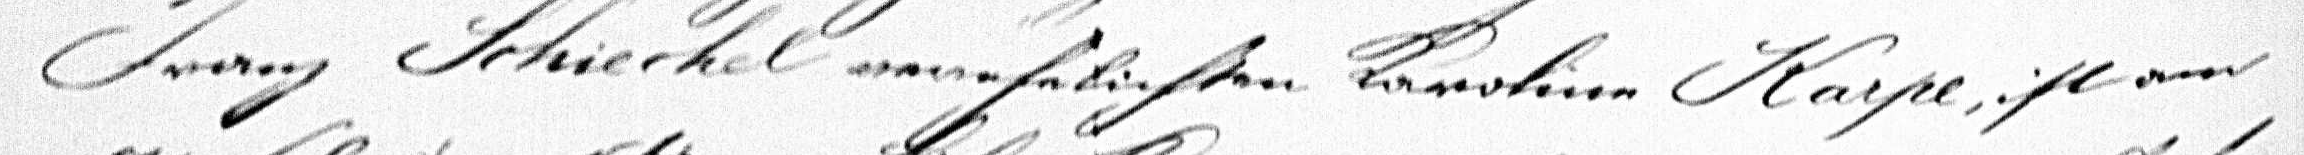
Franz Schieckel verehelichten Karoline Karpe, ist a
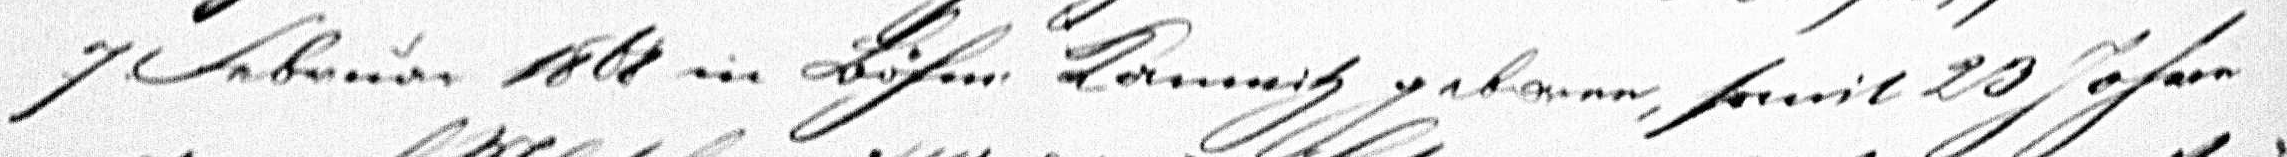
7 Februar 1868 in Böhm. Kamnitz geboren, somit 23 Jahre
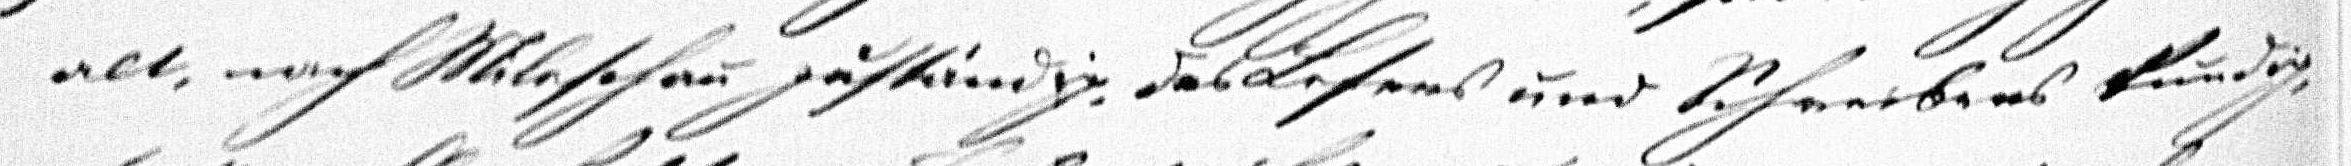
alt, nach Mileschau zuständig, das Lesens und Schreibens kundig,
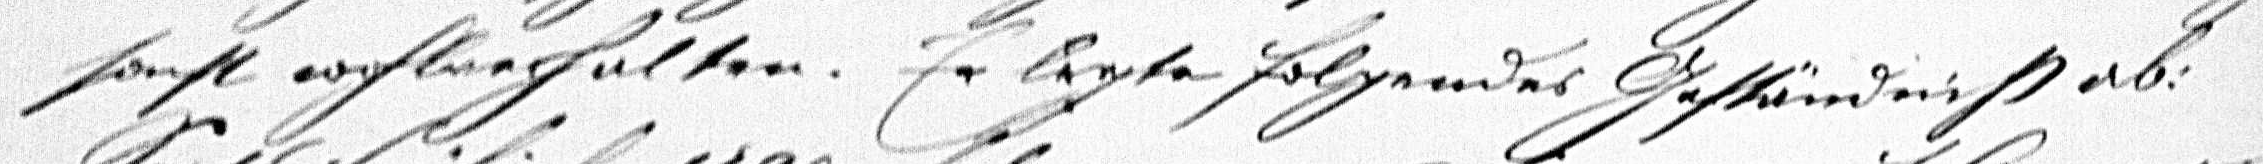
sonst wohlerhalten. Er legte folgendes Geständnis ab:
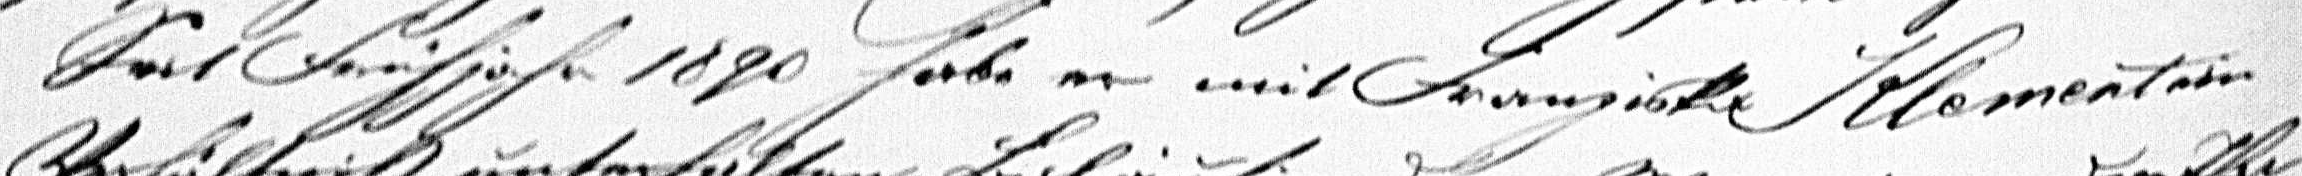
Seit Frühjahr 1890 habe er mit Franziska Klement ein
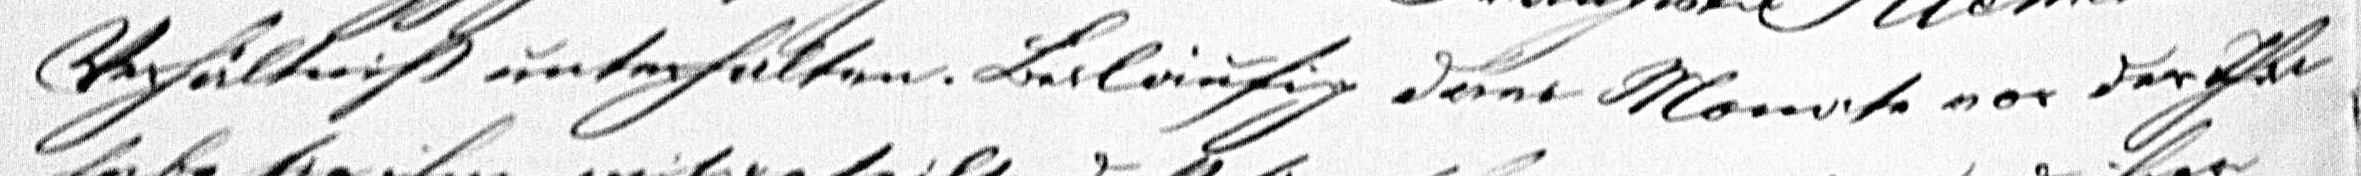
Verhältniß unterhalten. Beiläufig drei Monate vor der That
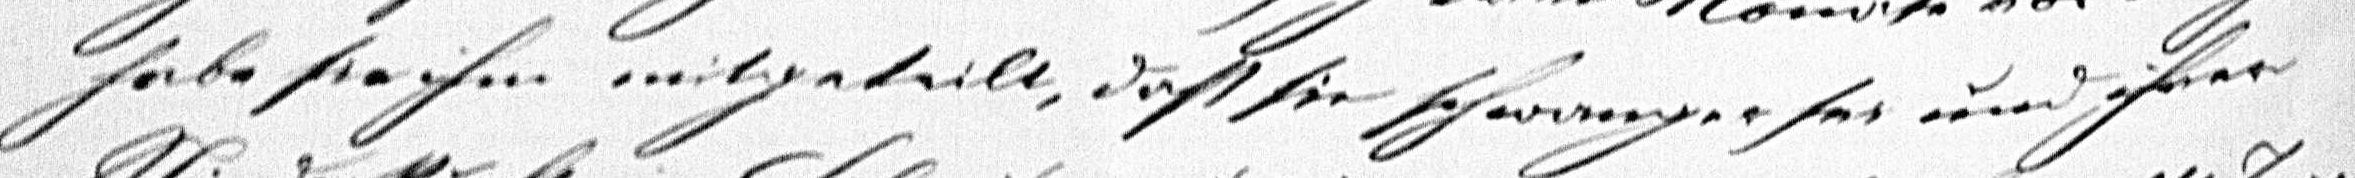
habe sie ihm mitgeteilt, daß sie schwanger sei und ihren
